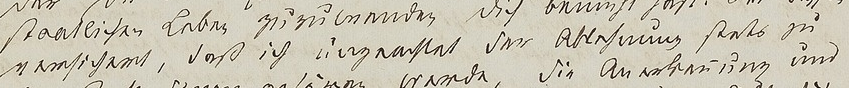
versichert, daß ich ungeachtet der Ablehnung stets zu
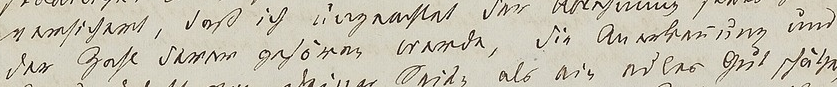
der Zahl derer gehören werde, die Anerkennung und
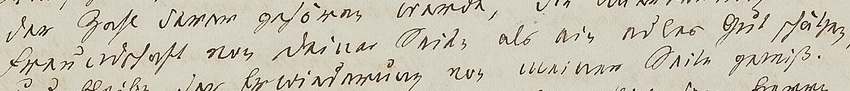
Freundschaft von Deiner Seite als ein edles Gut schätzen,
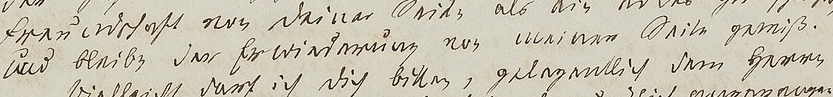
und bleibe der Erwiederung von meiner Seite gewiß.
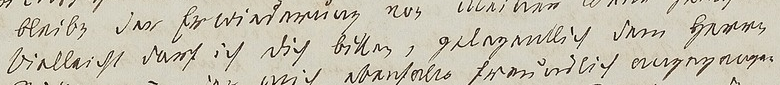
Vielleicht darf ich Dich bitten, gelegentlich dem Herrn
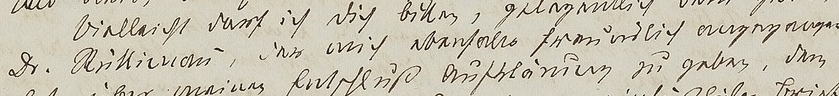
Dr. Rüttimann, der mich ebenfalls freundlich angegangen
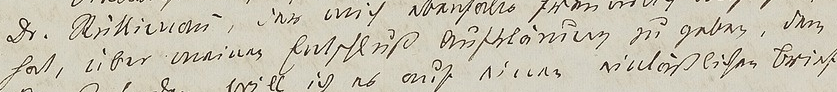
hat, über meinen Entschluß Aufklärung zu geben, dem
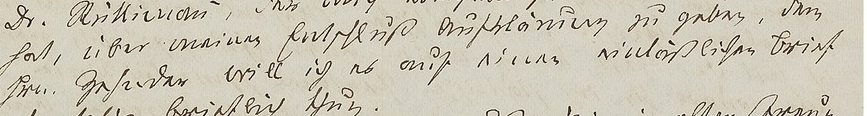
Hrn. Zehnder will ich es auf einen einläßlichen Brief
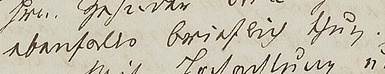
ebenfalls brieflich thun.
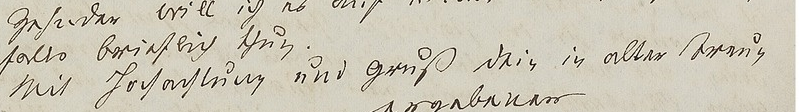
Mit Hochachtung und Gruß Dein in alter Treue
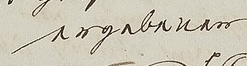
ergebener
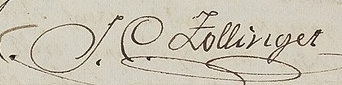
J. C. Zollinger
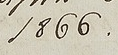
1866 .
